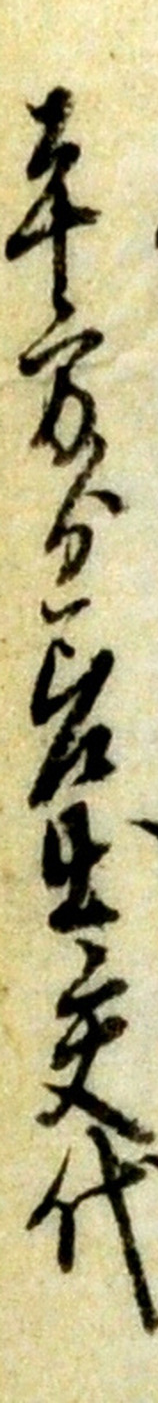平方ゟ差出交代
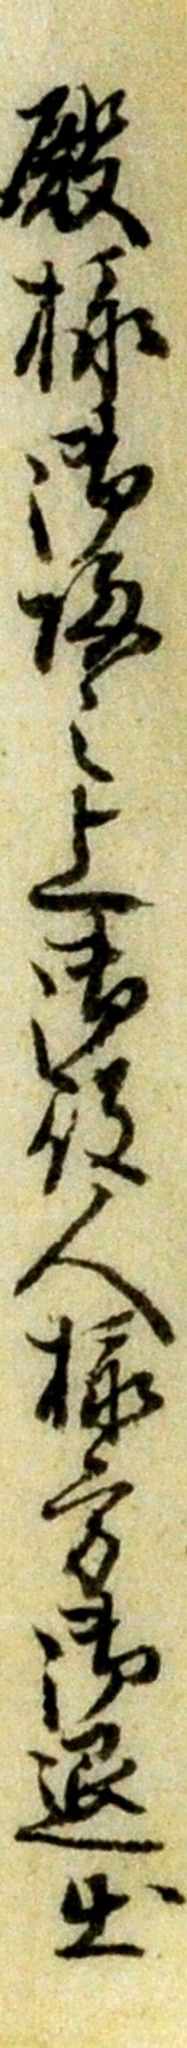殿様御帰之上御役人様方御退出
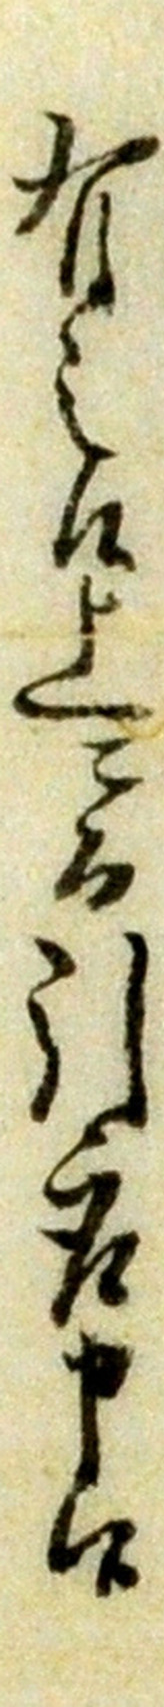有之候上ニ而引取申候
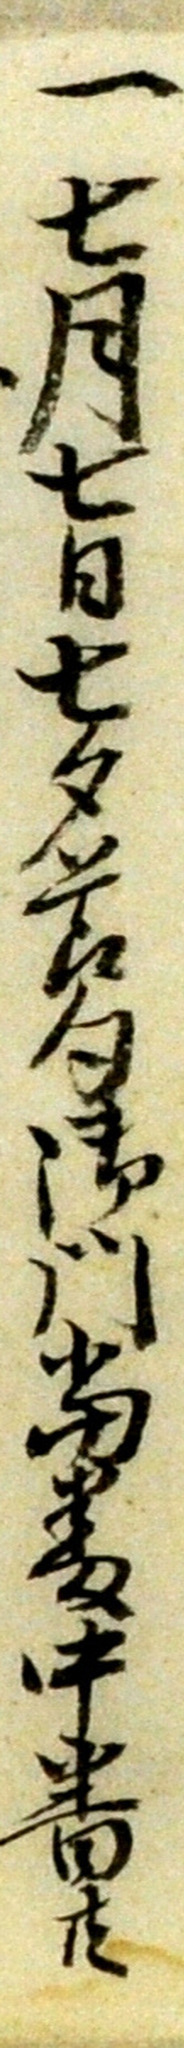一七月七日七夕節句御門当番中番共
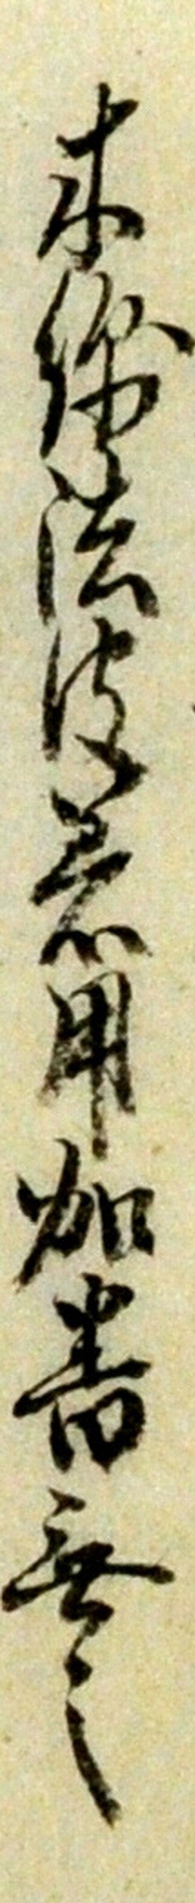木綿法被着用加番無之
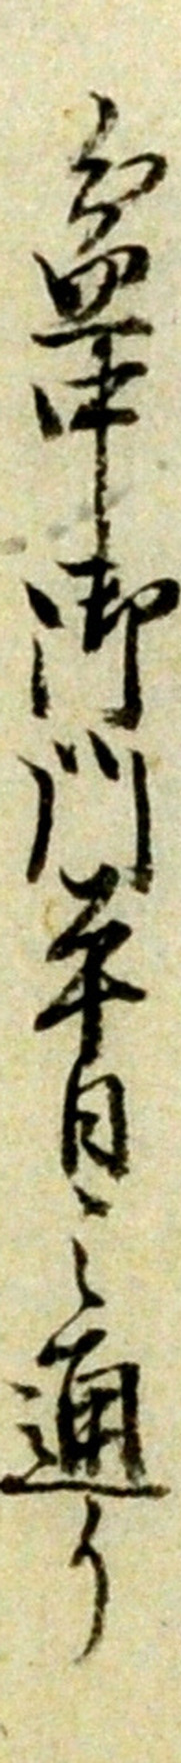盆中御門平日之通り
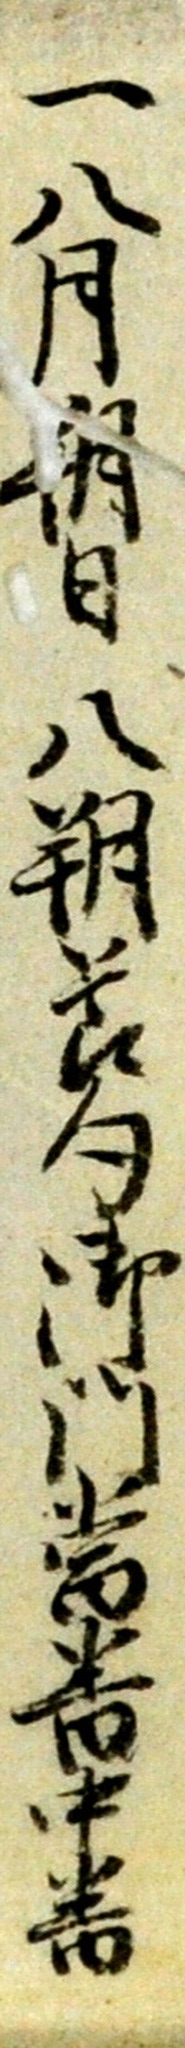一八月朔日八朔節句御門当番中番
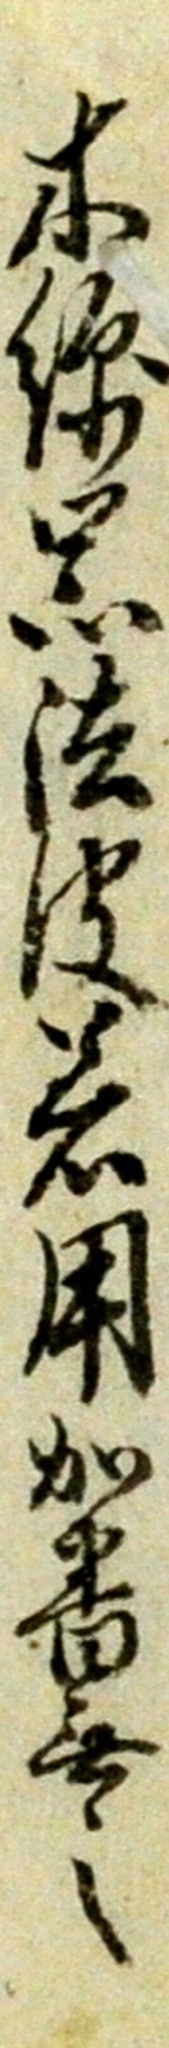木綿法被着用加番無之
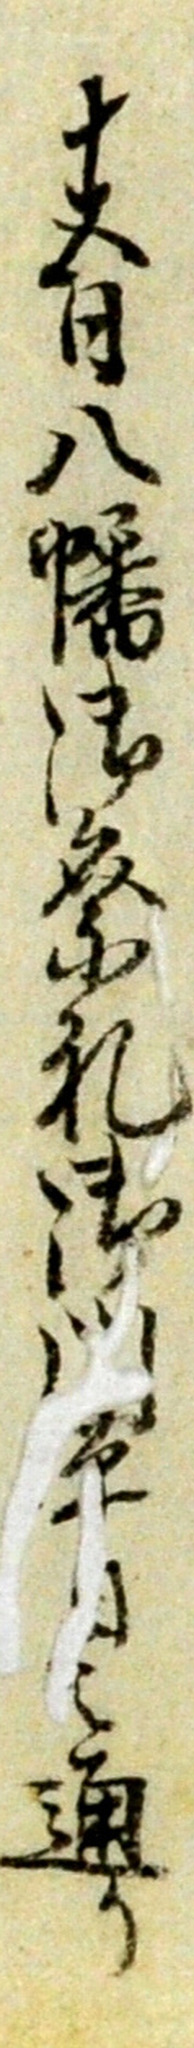十五日八幡御祭礼御門平日之通り
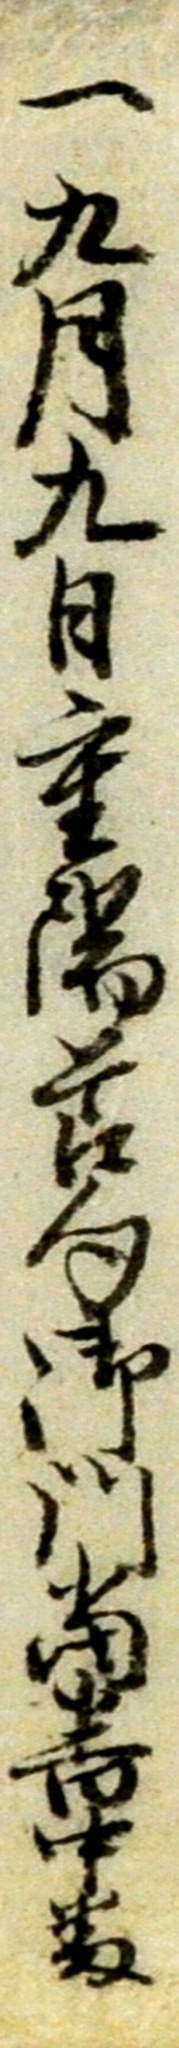一九月九日重陽節句御門当番中番
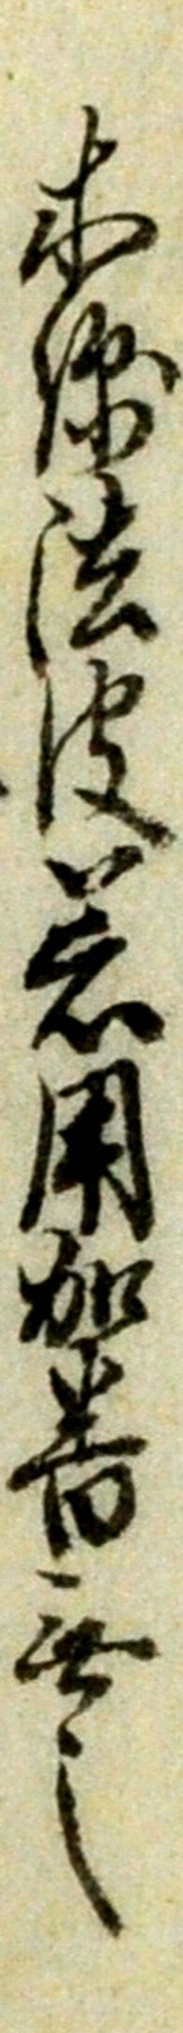木綿法被着用加番無之
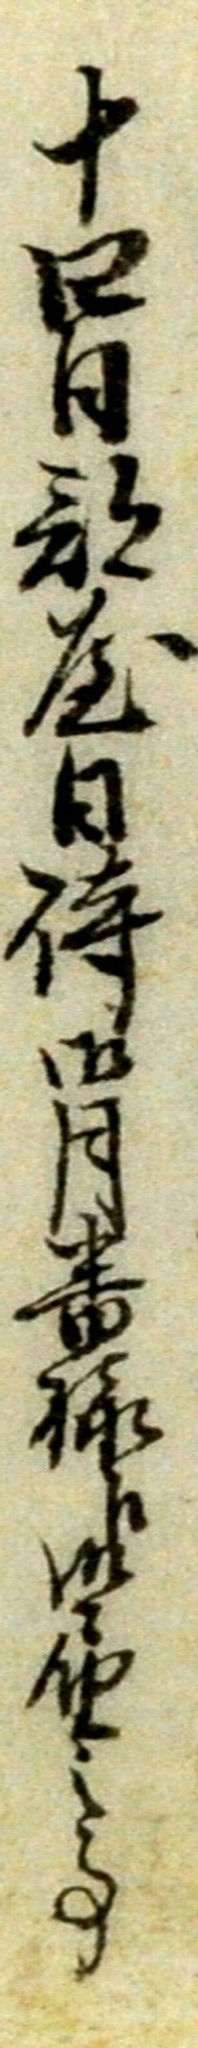十四日部屋日待御月番様江御届之事
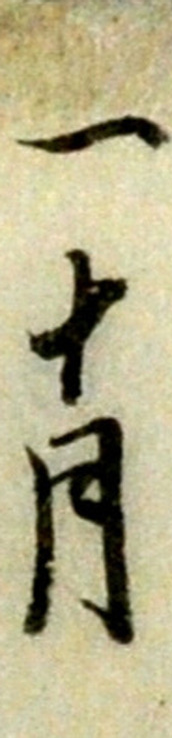一十月
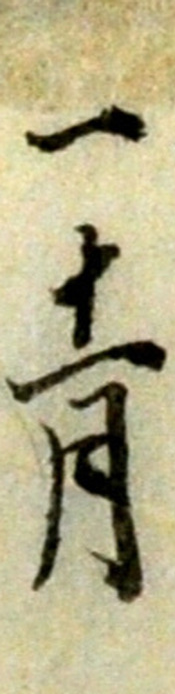一十一月
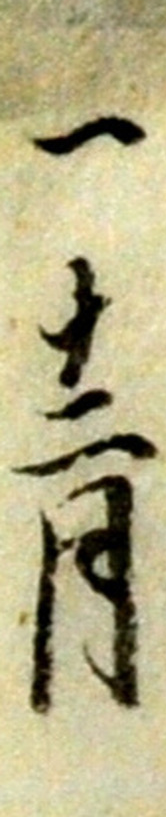一十二月

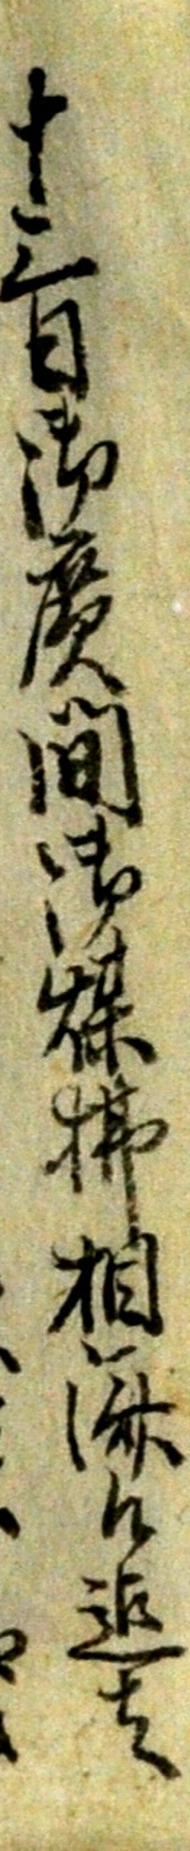十三日御広間御煤払相済候迄者
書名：御先手組江戸御屋敷御門番勤方
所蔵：伊那市立高遠町図書館・合同会社AMANE
